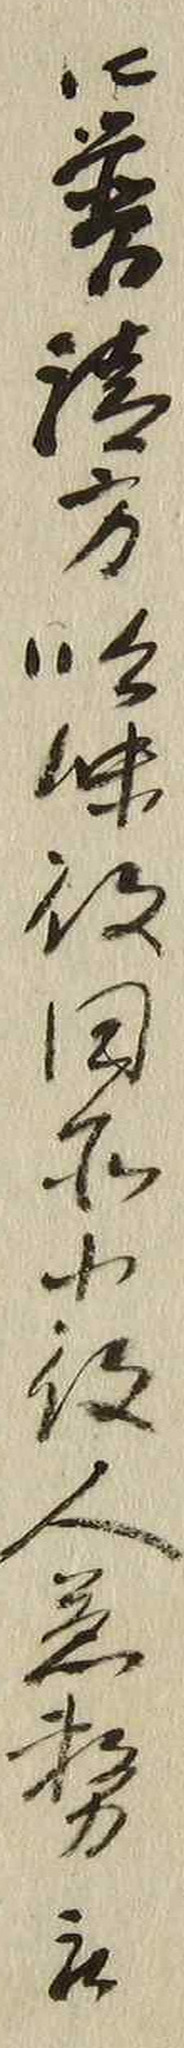御普請方吟味役同所小役人兼務被
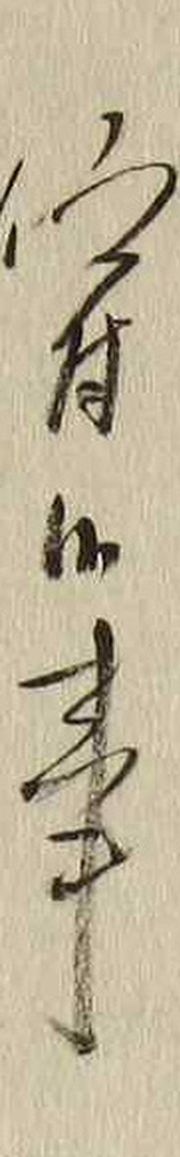仰付候事
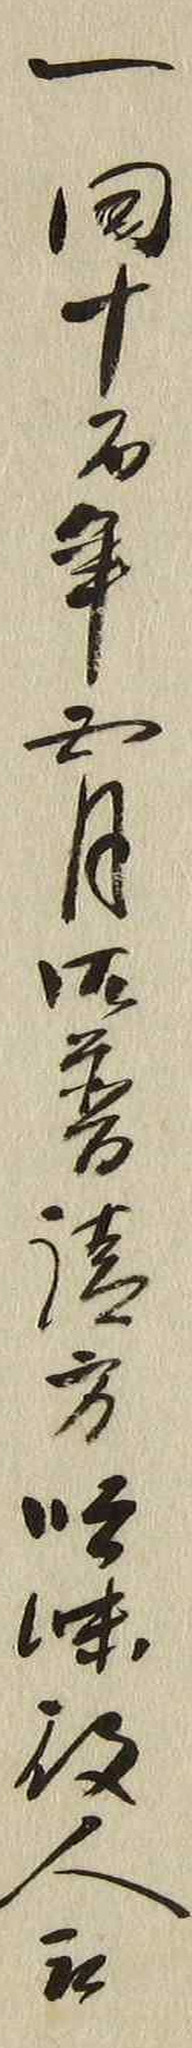一同十酉年五月御普請方吟味役人被
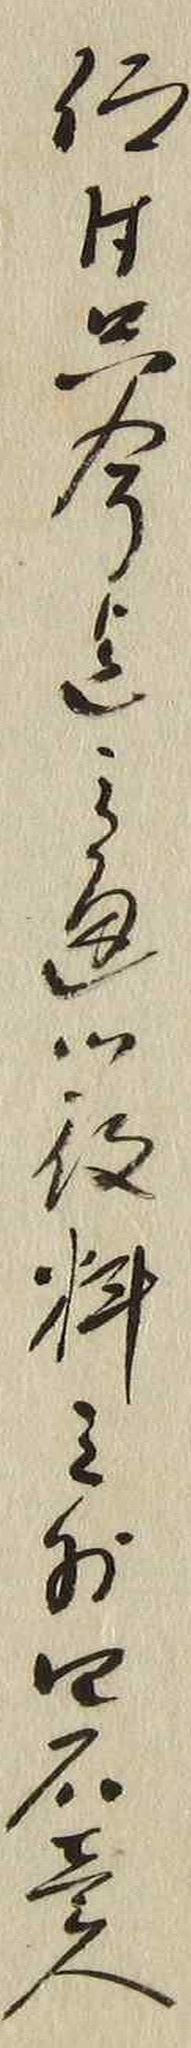仰付只今迄之通御役料之外四石壱人
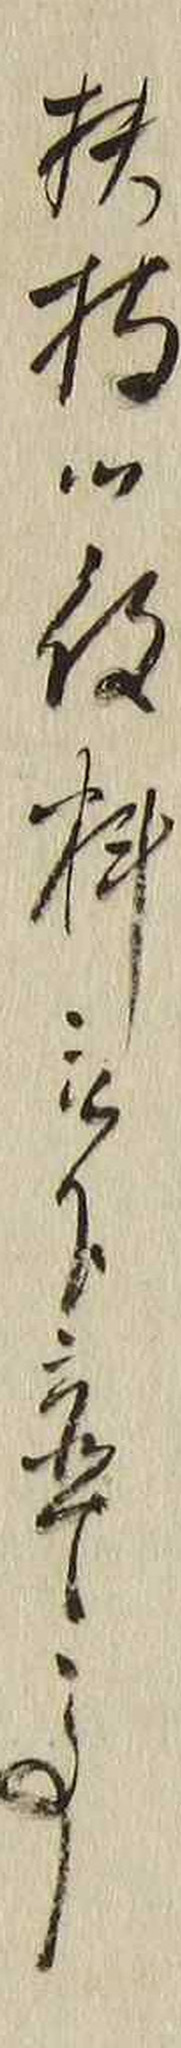扶持御役料被下置候事
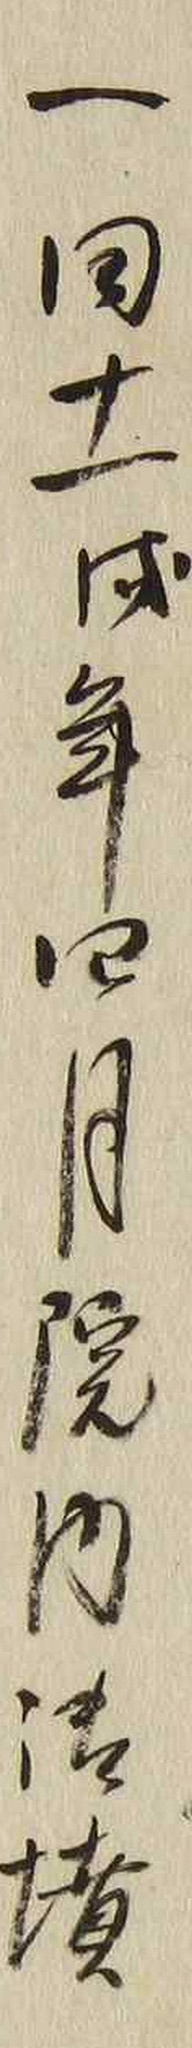一同十一戌年四月院内御墳
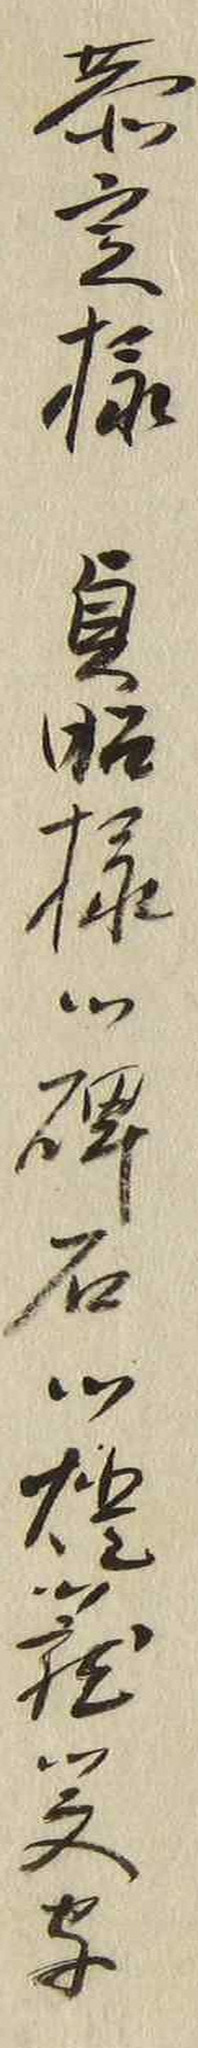恭定様貞昭様御碑石御灯篭御文字
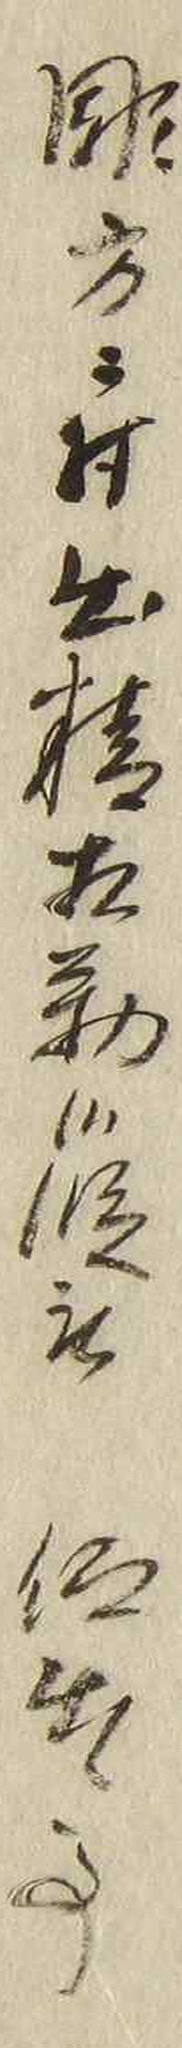彫方ニ付出精相勤候段被仰出候事
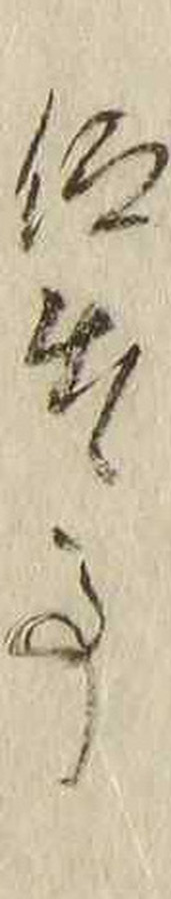仰付候事

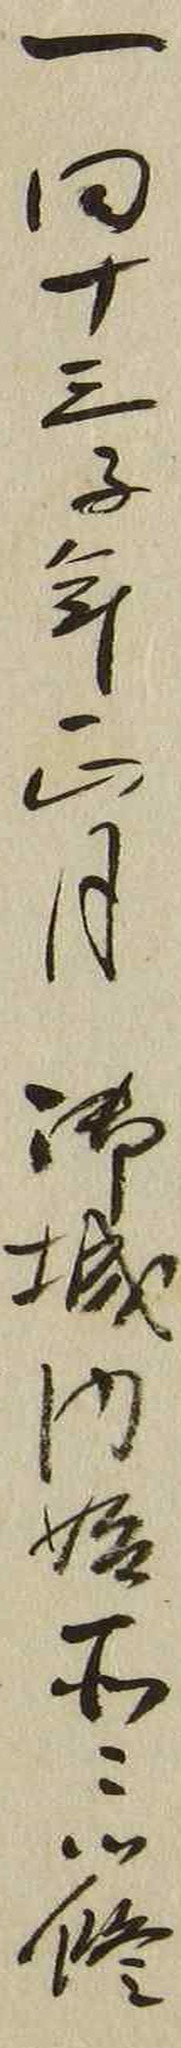一同十三子年六月御城内始所々御修
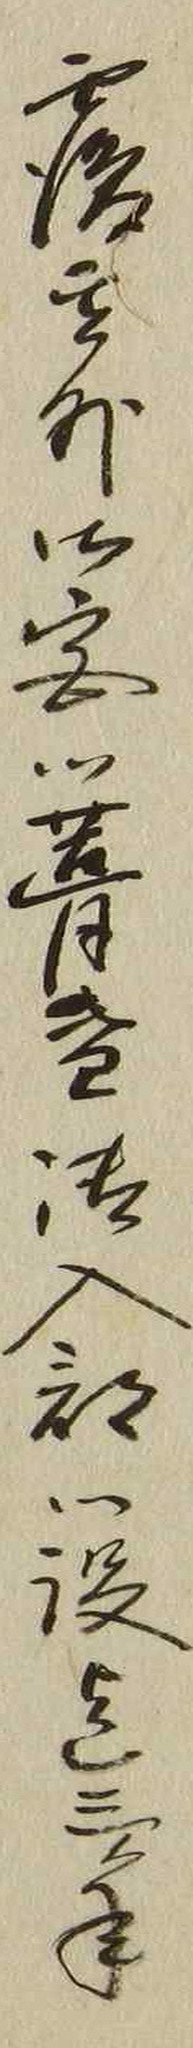覆其外御宮御葺替御入部御設迄三ヶ年
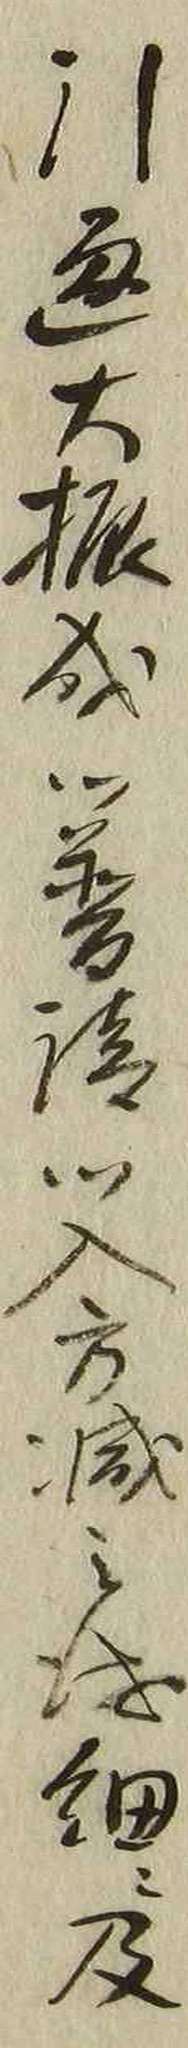引通大振成御普請御入方減之儀細ニ及
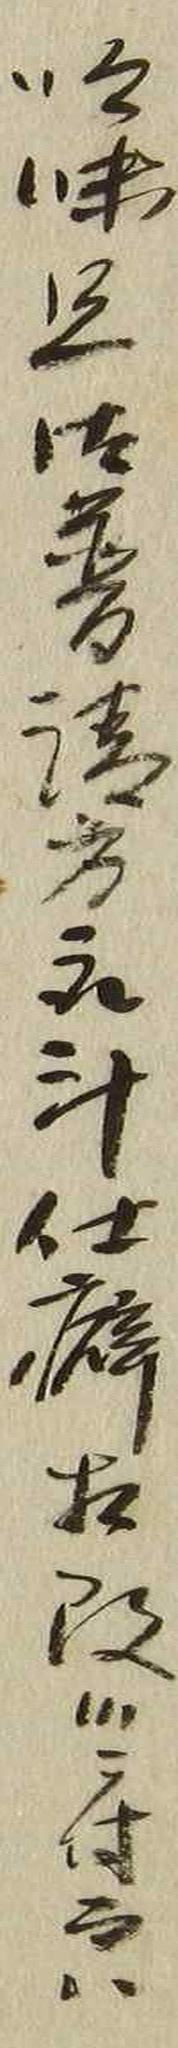吟味宜御普請方取斗仕癖相改候ニ付而ハ
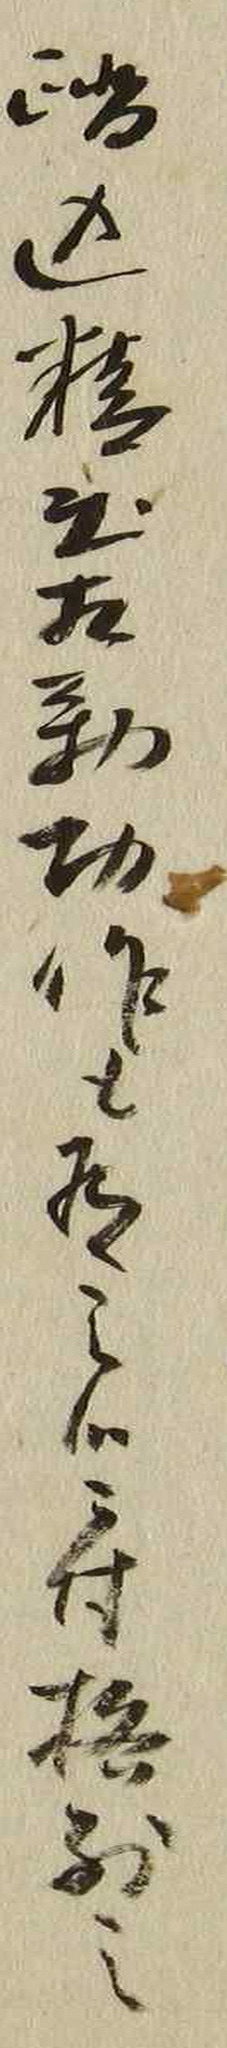踏込精出相勤功作も有之候ニ付格別之
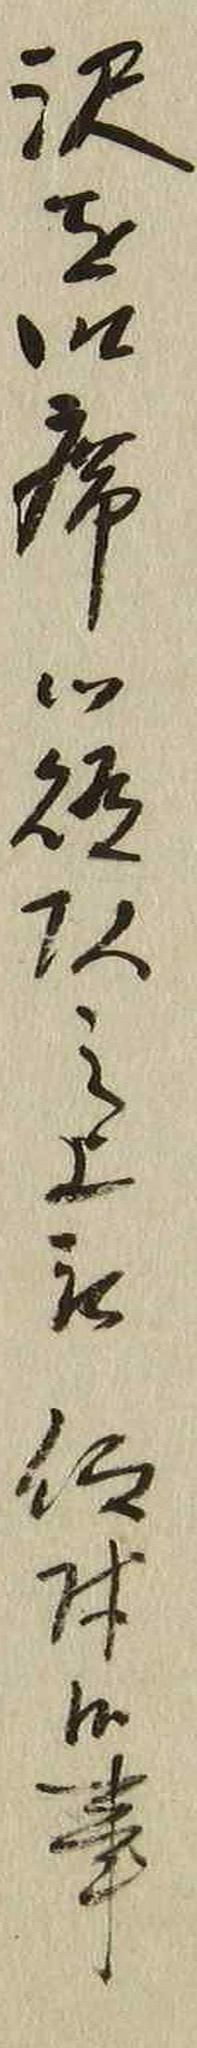訳を以席御賄頭之上被仰付候事
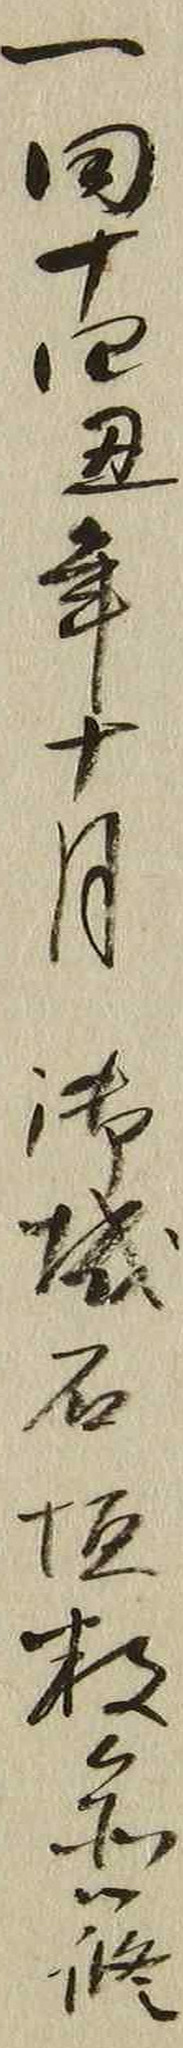一同十四丑年十月御城石垣数ヶ所御修
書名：諸士系譜　巻之360　す之部10
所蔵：会津若松市立会津図書館
